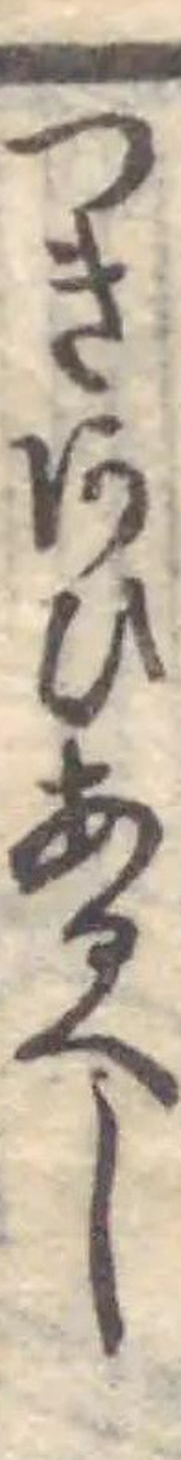つきあひあるへし
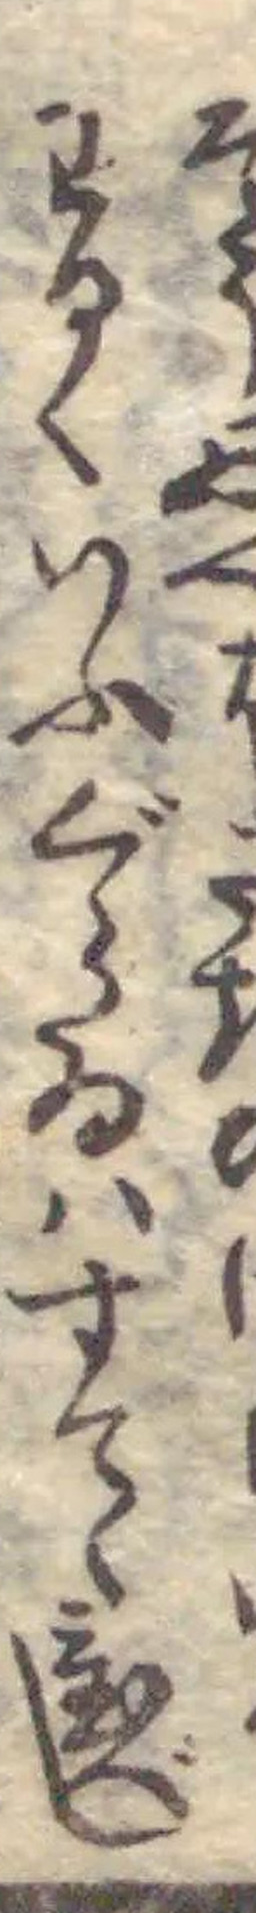わるくいふぐらゐはすてゝ置べし
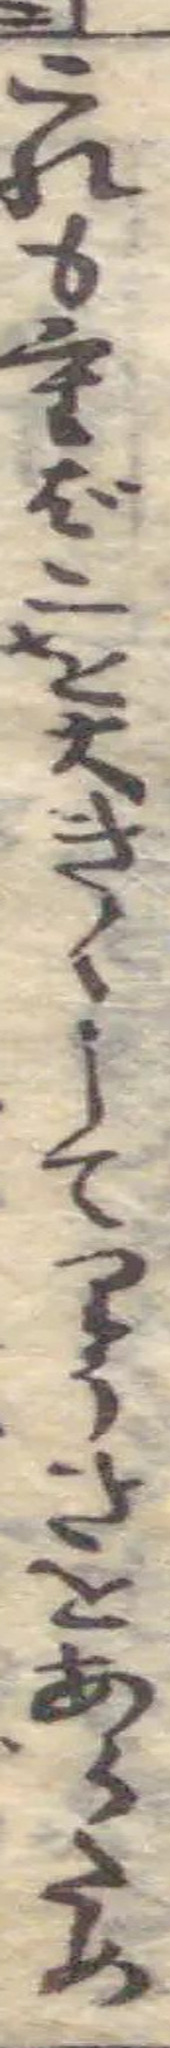これも重ばこを大きくしてりううきをあらため
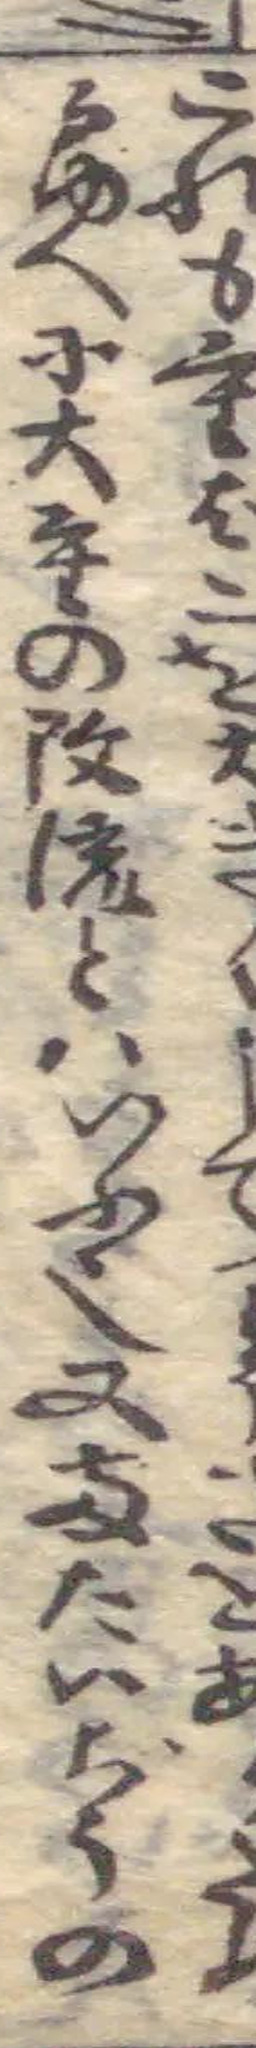るゆへに大重の改流といふ也又両たいぢうの
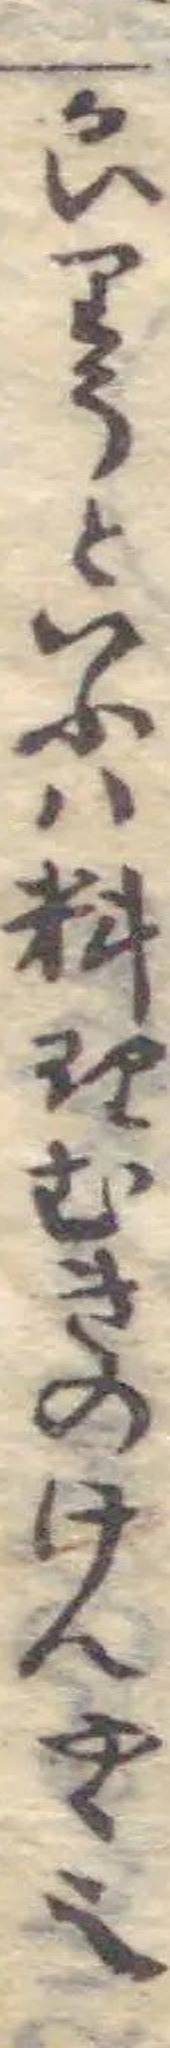かいりうといふは料理むきのけんやく也
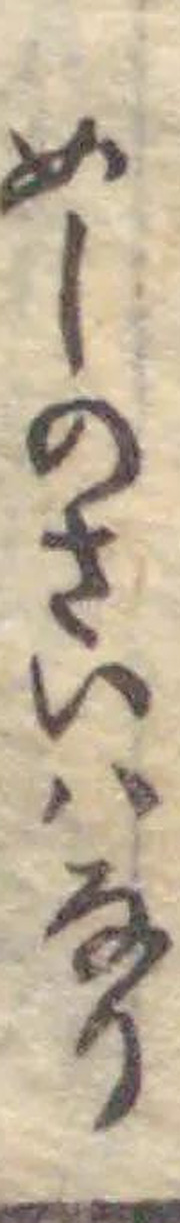めしのさいはなり
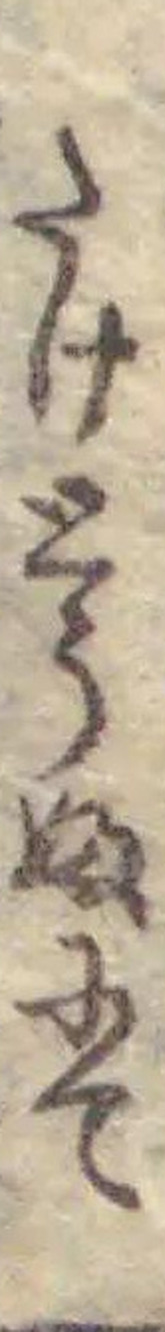たけとうふにて
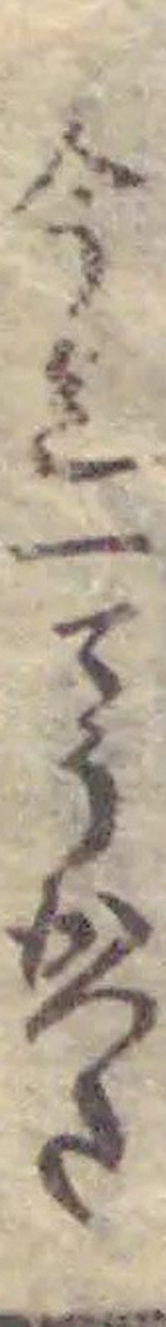今迄一てうかつた
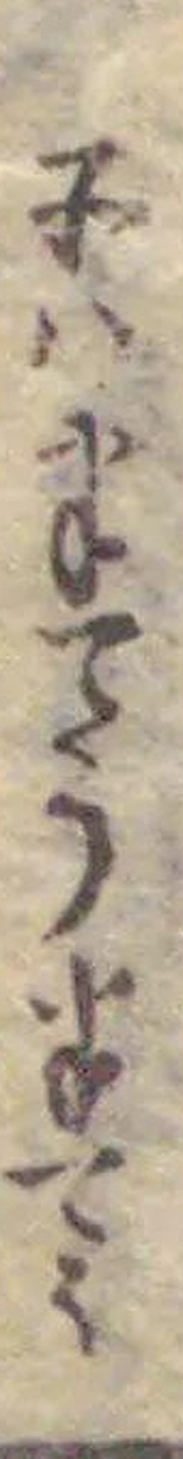所は半てう半てう

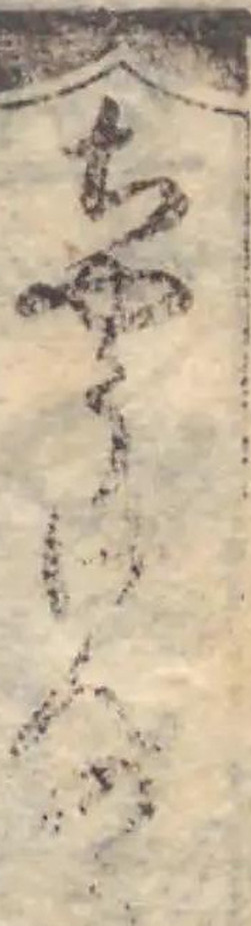ちやうけんの法
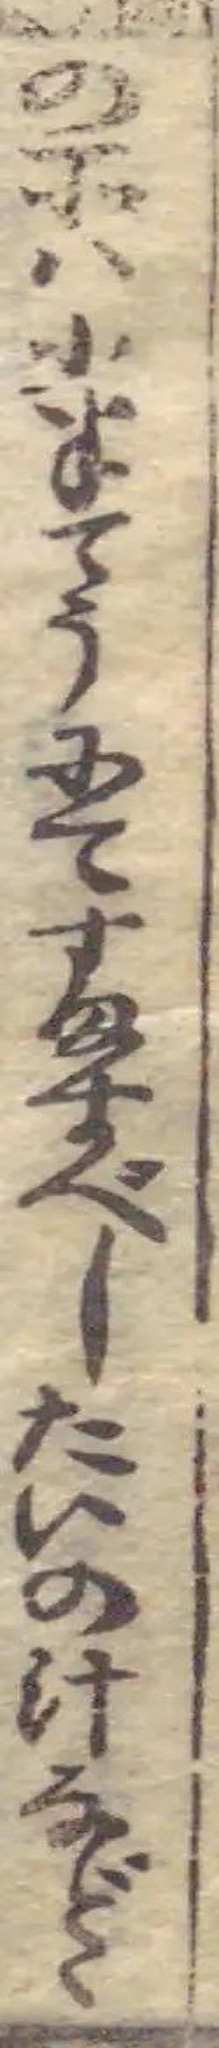の所は小半てうにてすますべしたいの知るなどゝ
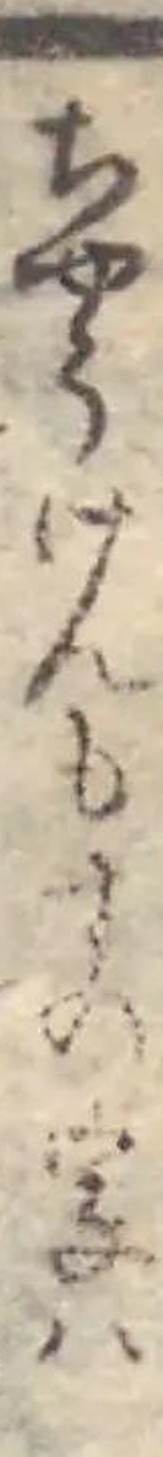ちやうけんもすの字は
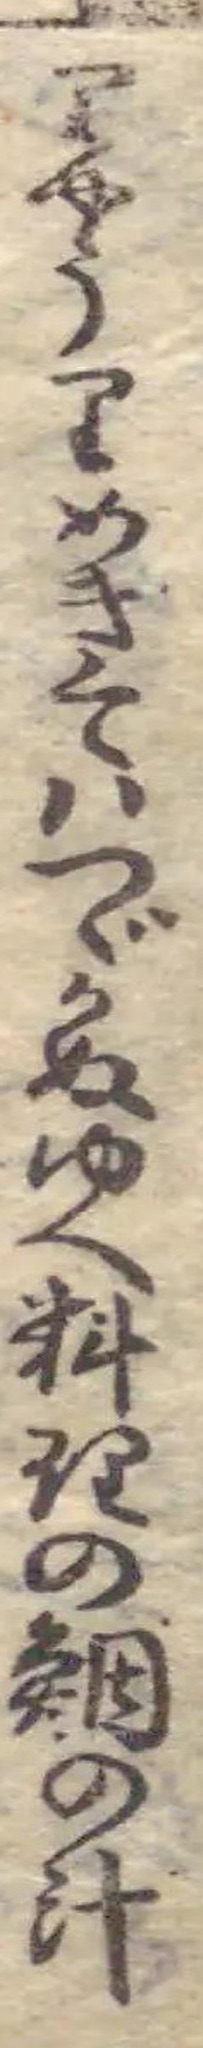りやうりめきてはつゞかぬゆへ料理の鯛の汁
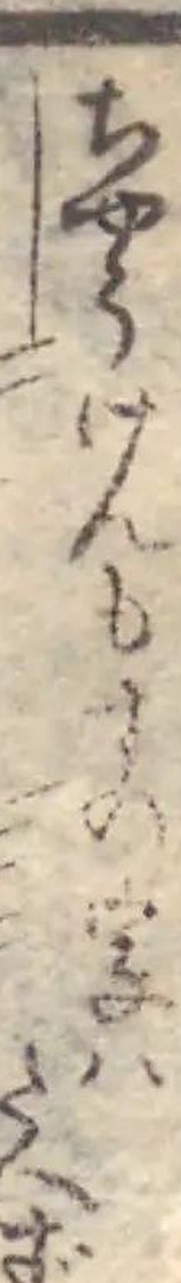ちやうけんもすの字は
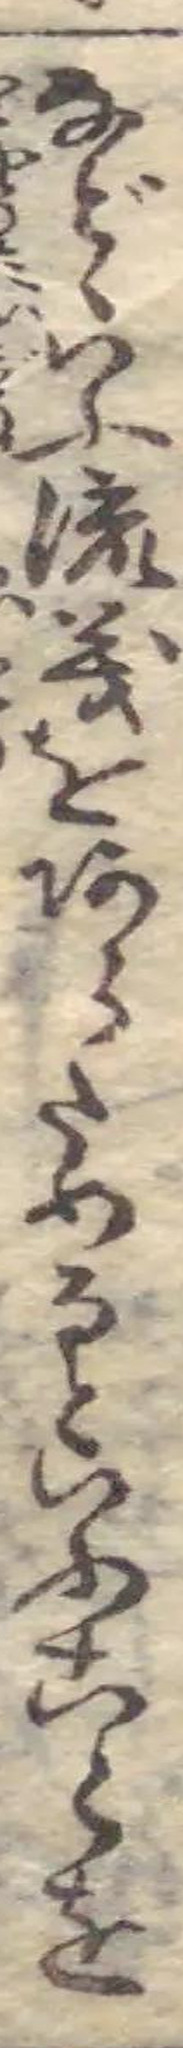などゝいふ流儀をあらためるといふことを
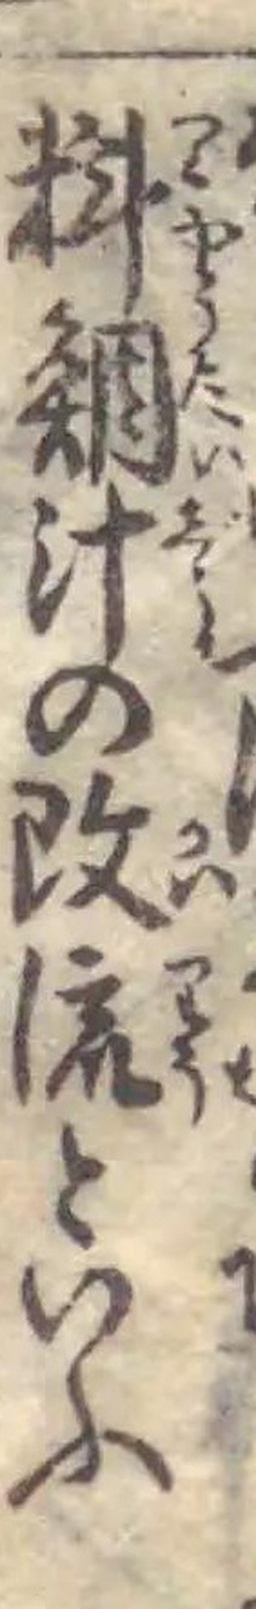料鯛汁の改流といふ
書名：大通人好記
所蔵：国立国会図書館 National Diet Library, JAPAN
